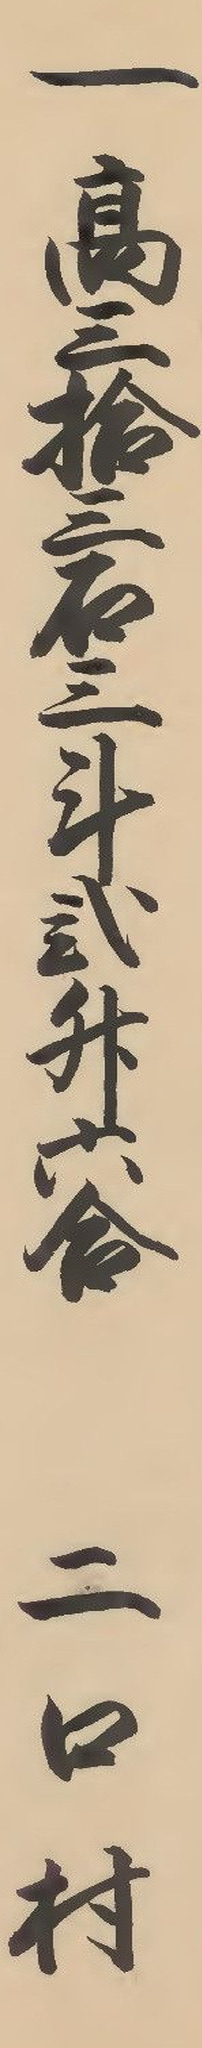一高三拾三石三斗弐升六合二口村
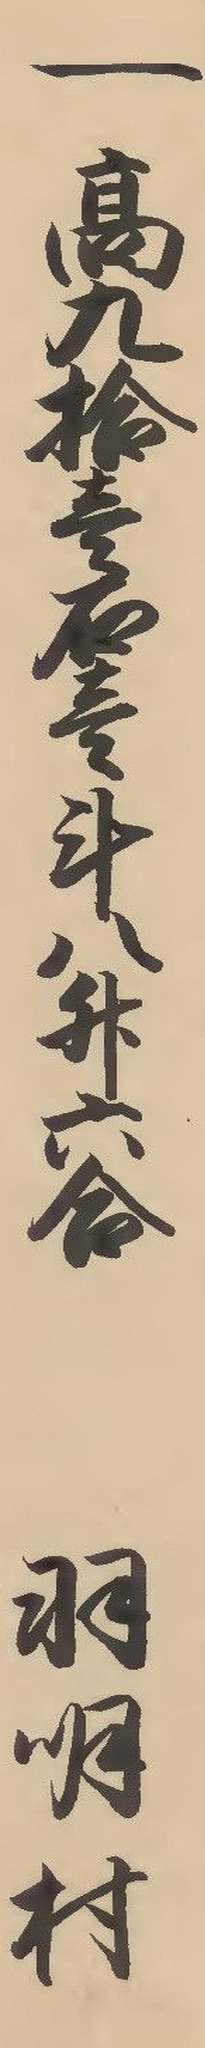一高九拾壱石壱斗八升六合羽明村
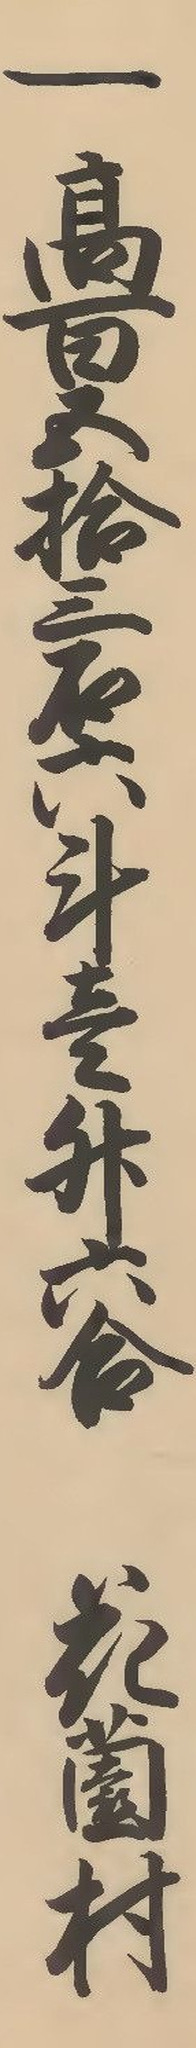一高百五拾三石六斗壱升六合花薗村
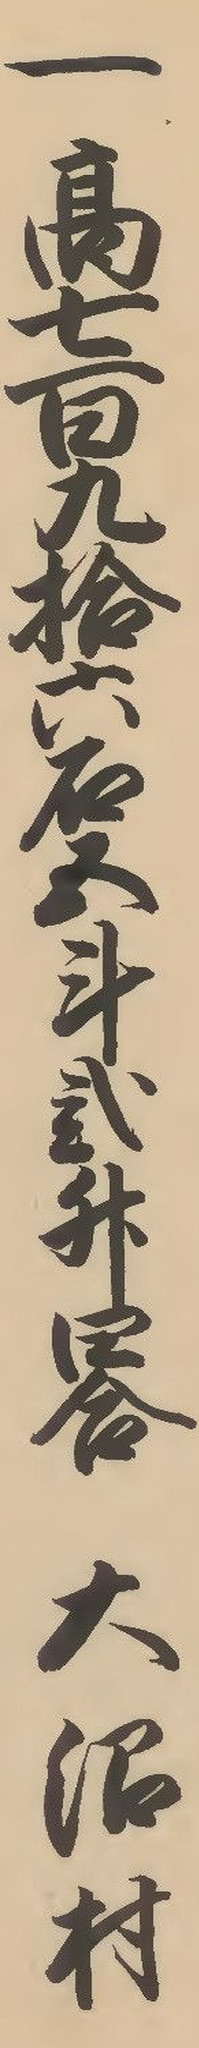一高七百九拾六石五斗弐升四合大沼村
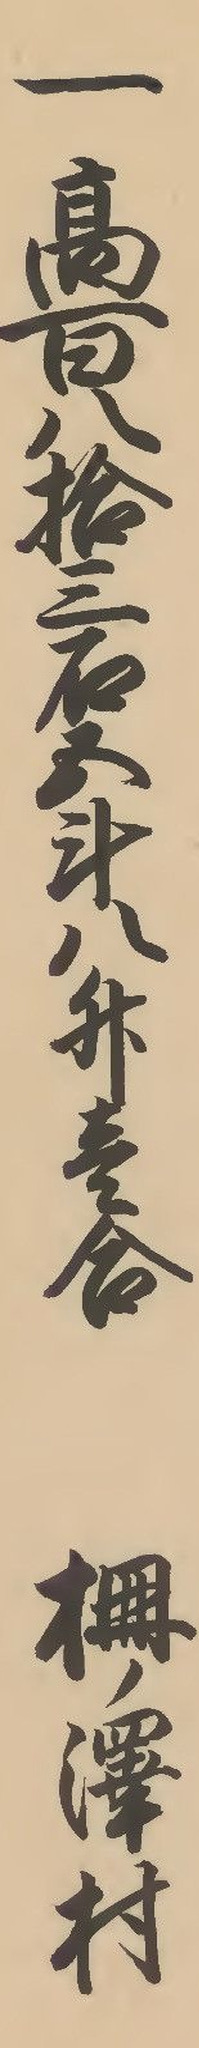一高百八拾三石五斗八升壱合柵ノ沢村

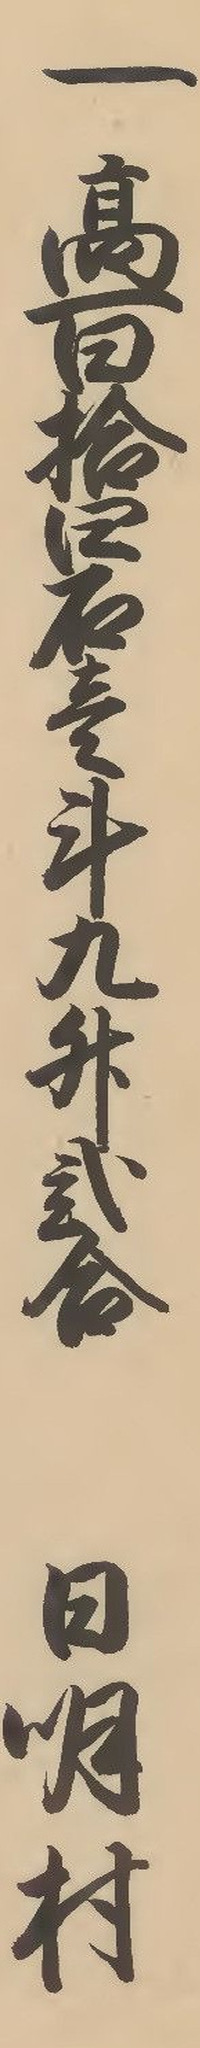一高百拾四石壱斗九升弐合日明村
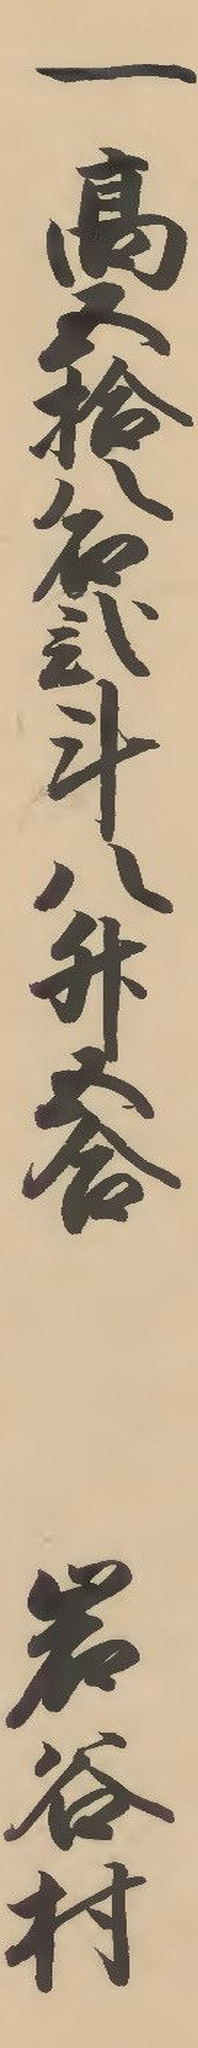一高五拾八石弐斗八升五合岩谷村
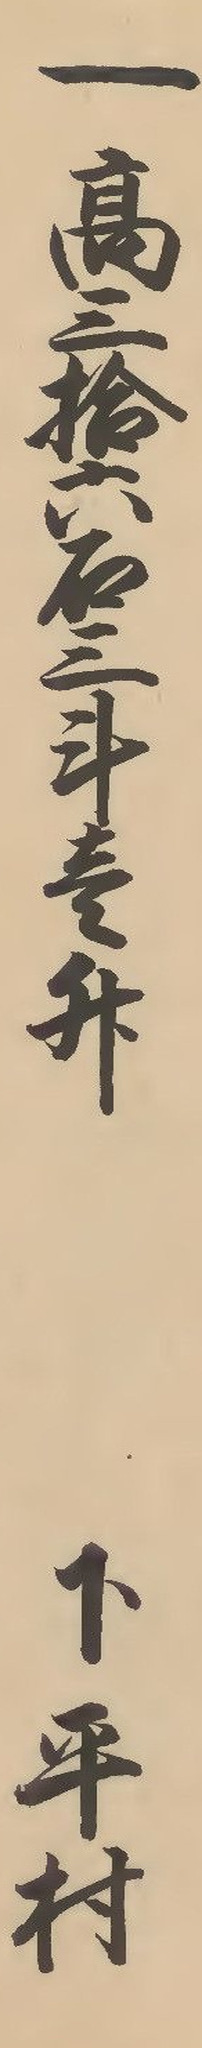一高三拾六石三斗壱升下平村
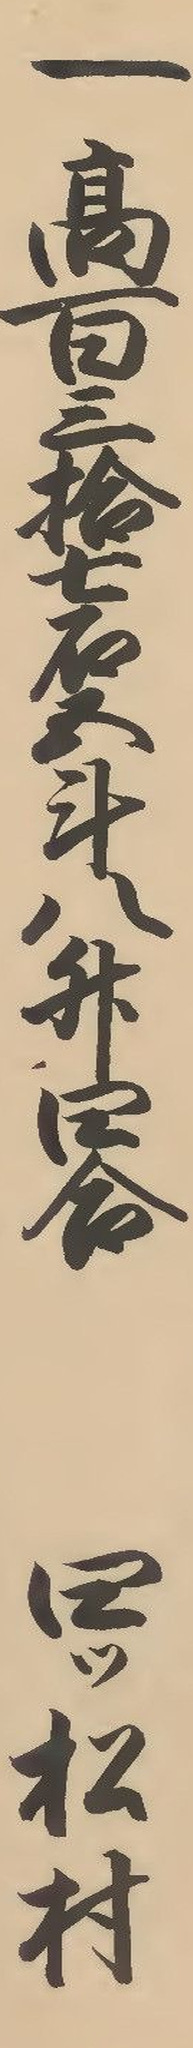一高百三拾七石五斗八升四合四ツ松村
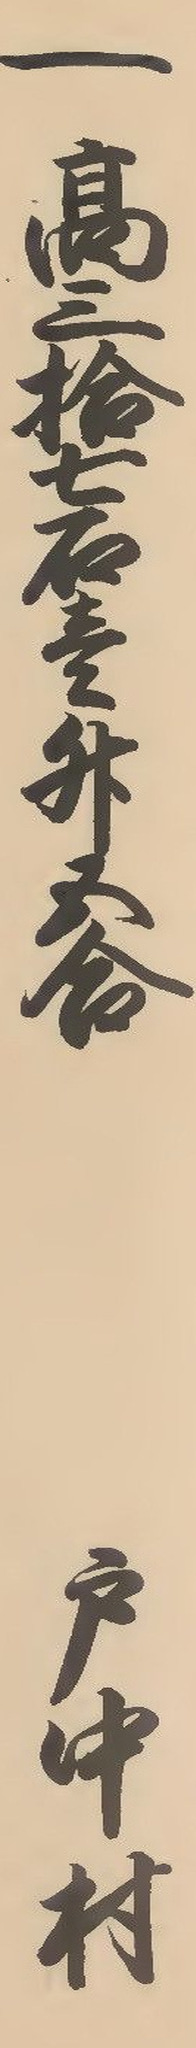一高三拾七石壱升五合戸中村
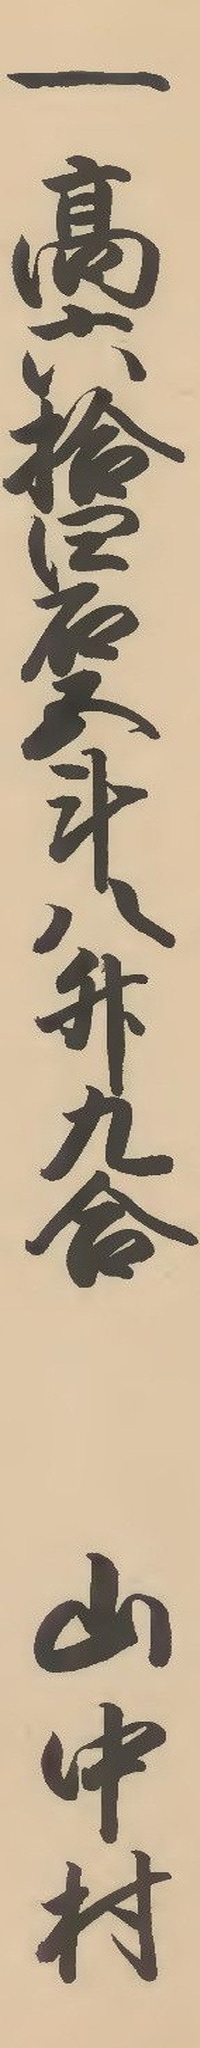一高六拾四石五斗八升九合山中村
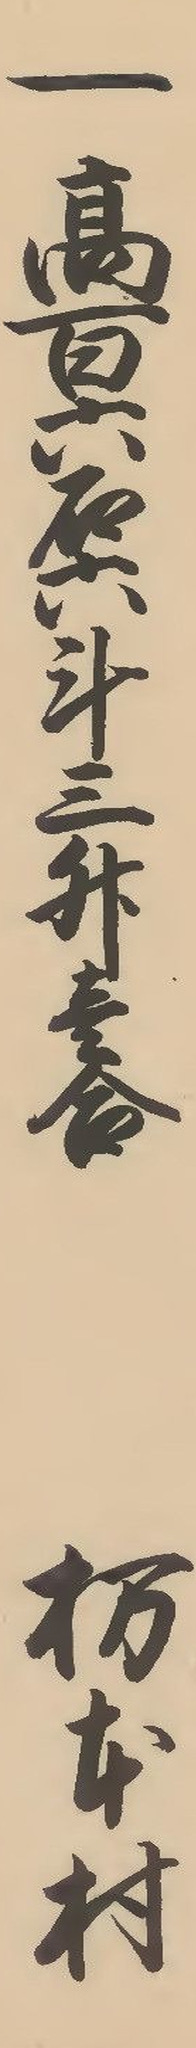一高百六石六斗三升壱合栃本村
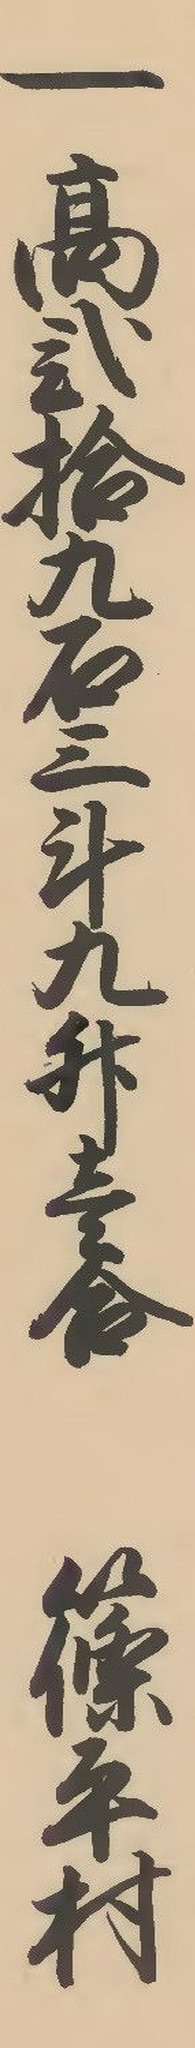一高弐拾九石三斗九升壱合篠平村

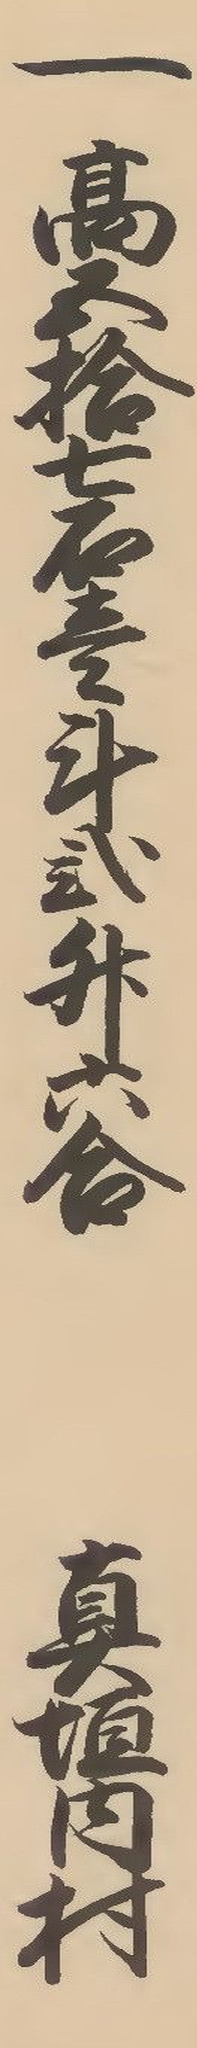一高五拾七石壱斗弐升六合真垣内村
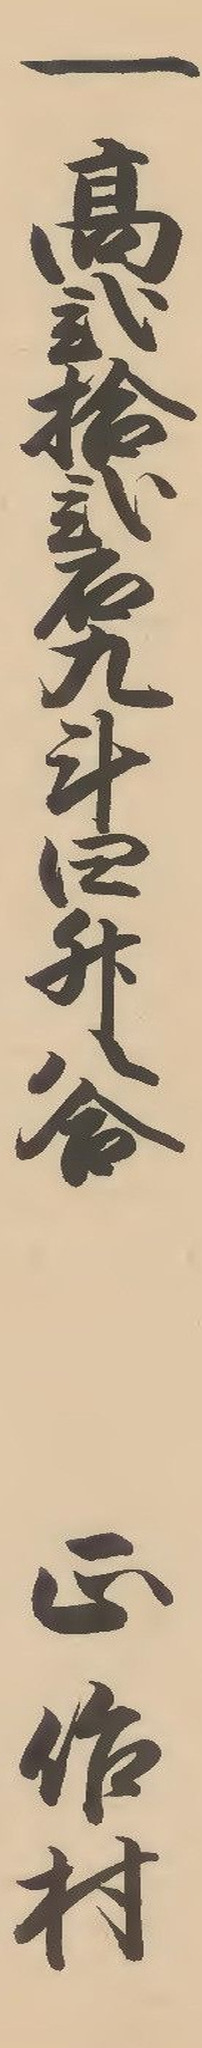一高弐拾弐石九斗四升八合正作村
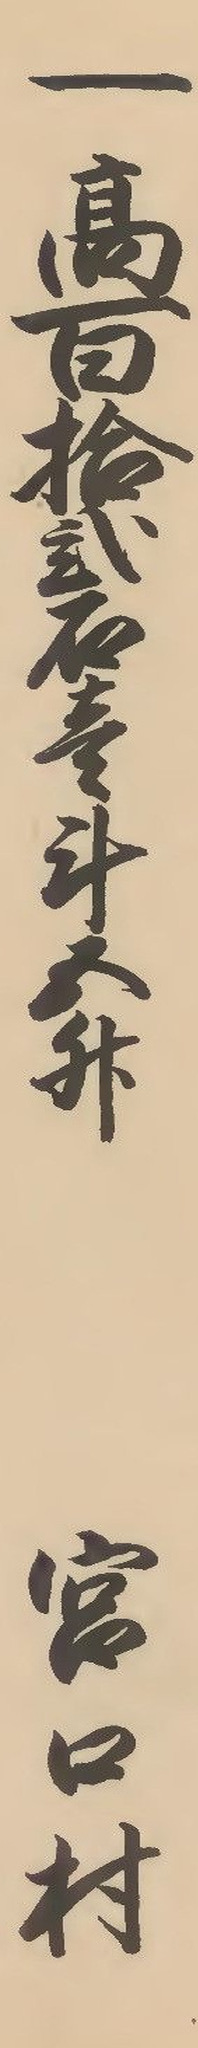一高百拾弐石壱斗五升宮口村
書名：三河国郷帳
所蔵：国立公文書館 National Archives of Japan
